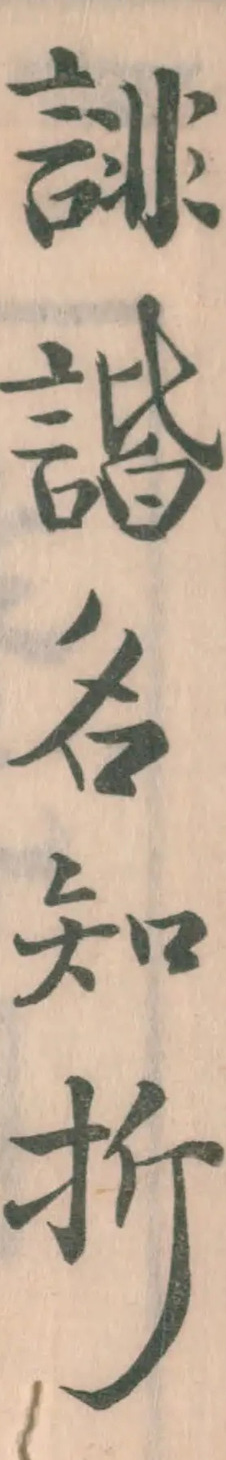誹諧名知折
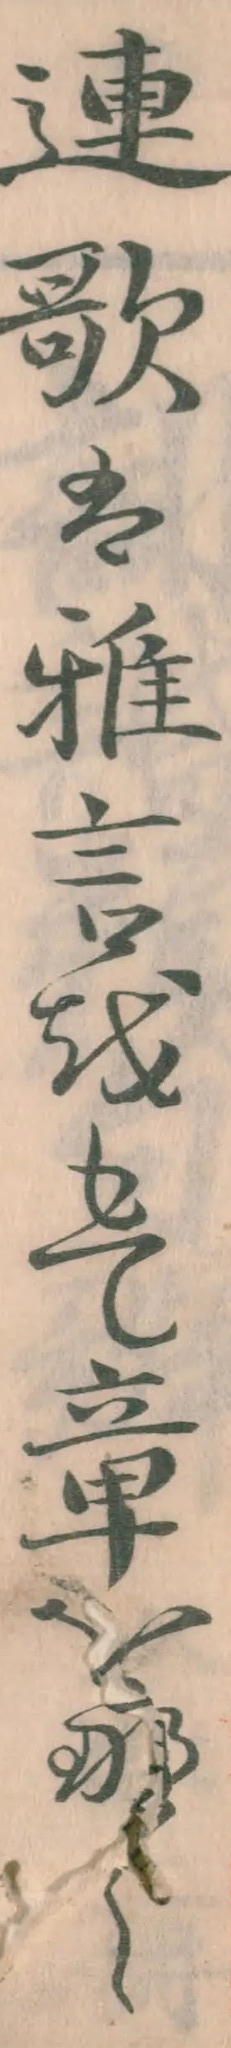連歌は雅言をもて章をなし
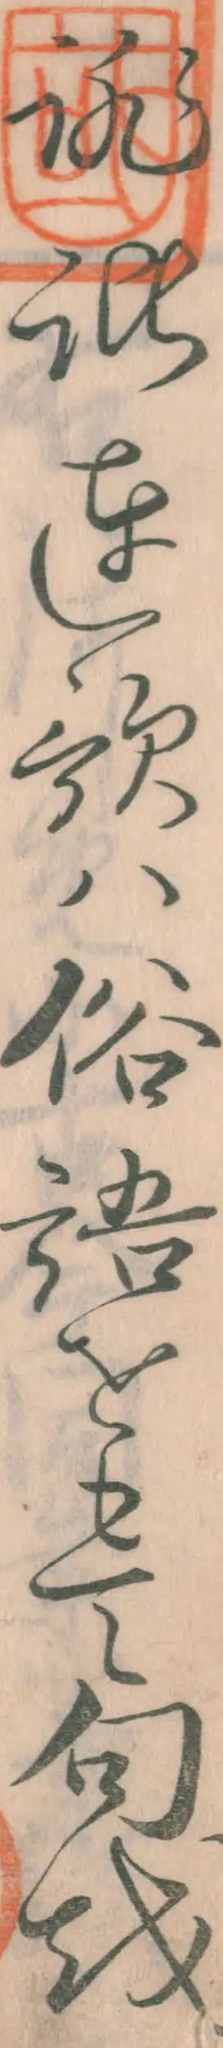誹諧連歌は俗語をもて句を
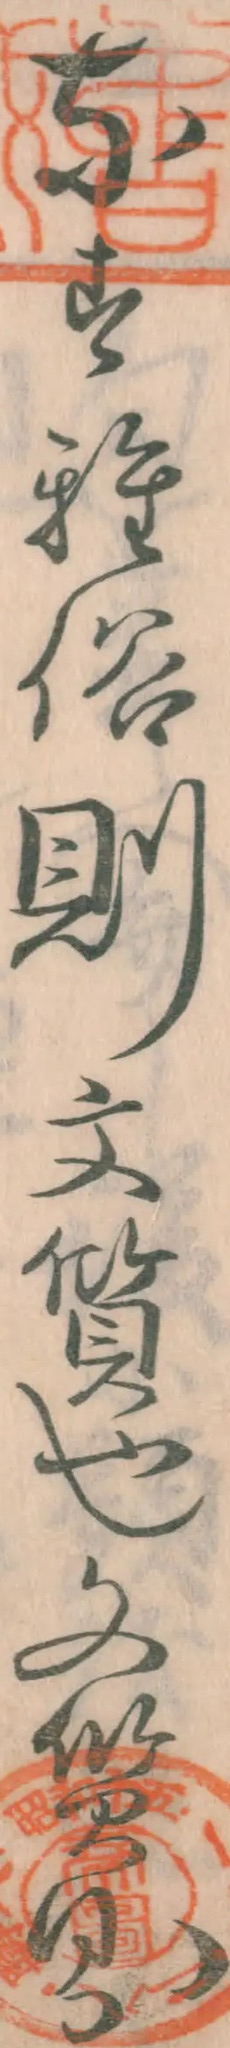なす雅俗則文質也文質則
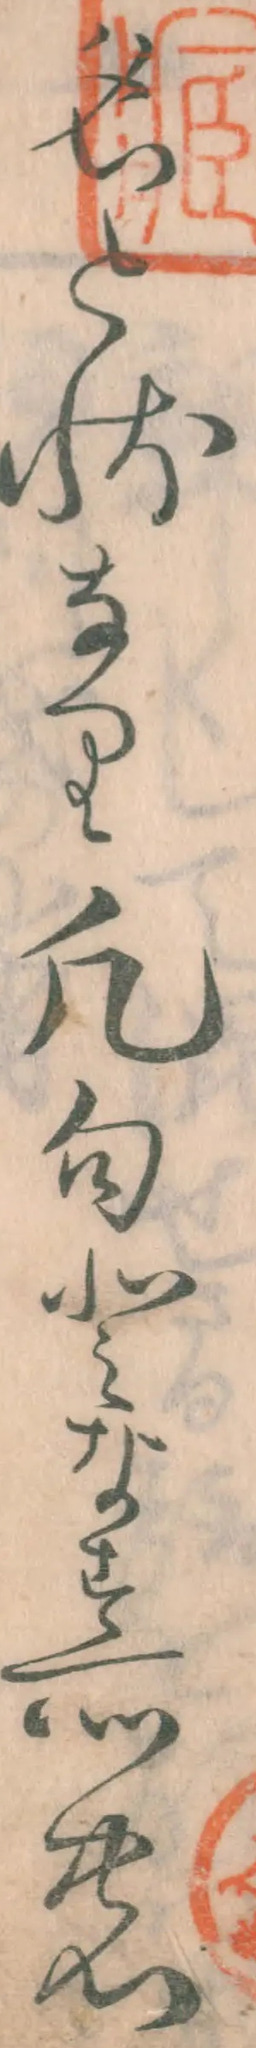名と状なり凡句となす所の
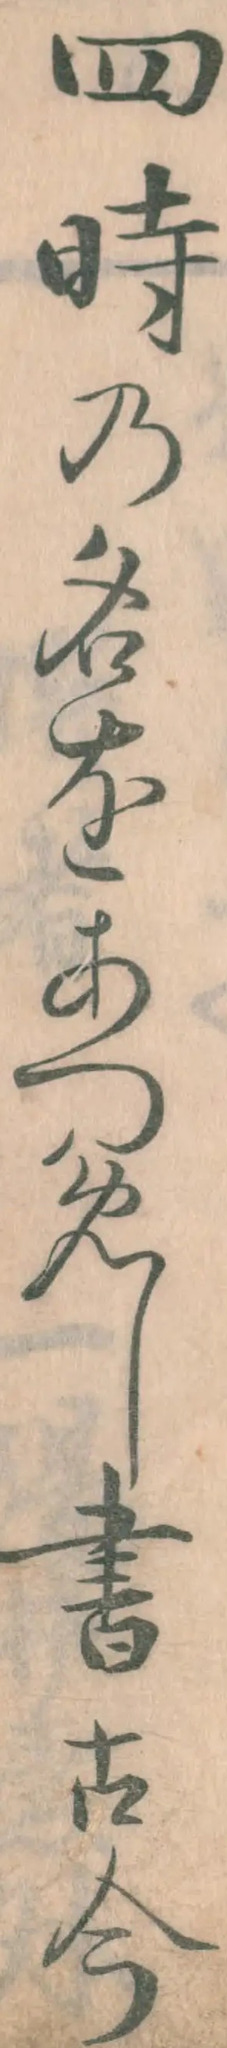四時の名をあつめし書古今
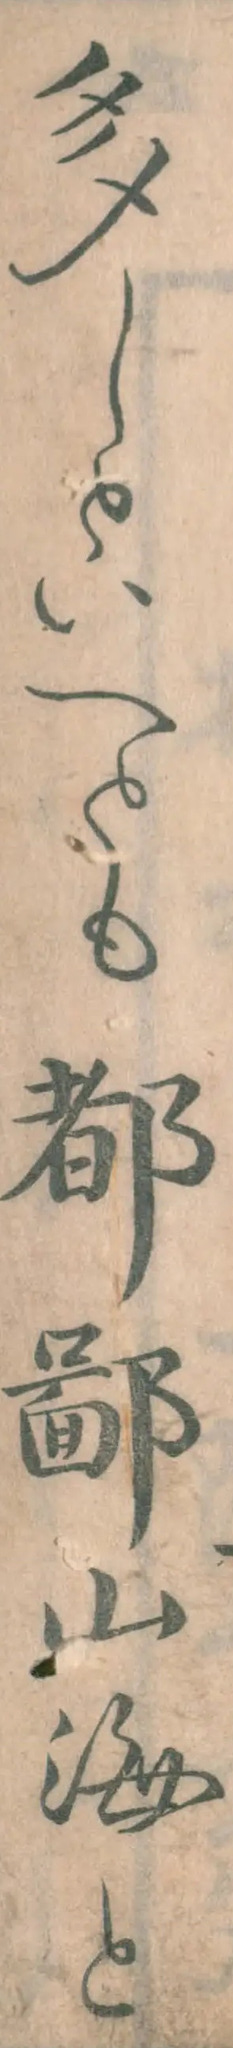多しといへとも都鄙山海と

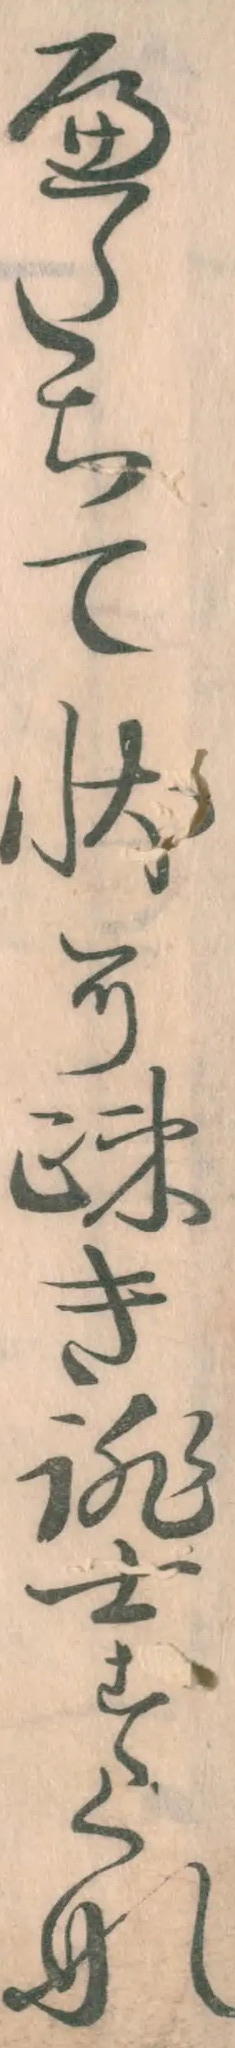へたちて状に疎き誹士すくな
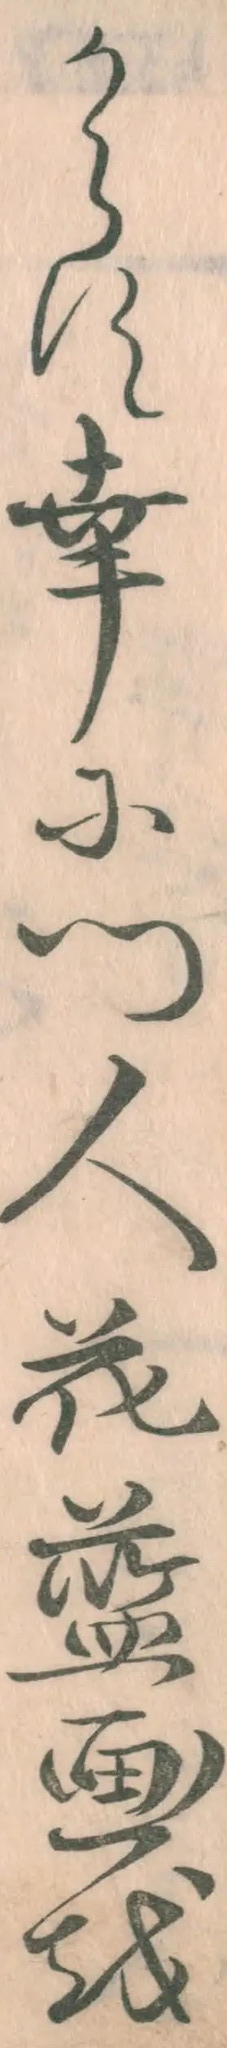からす幸につ人花藍画を
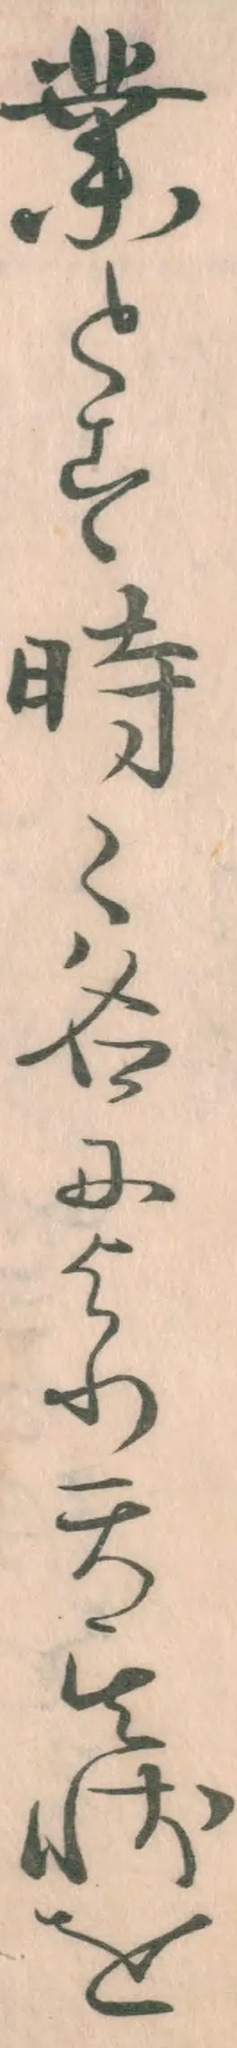業とす時々各に与りまた其状を
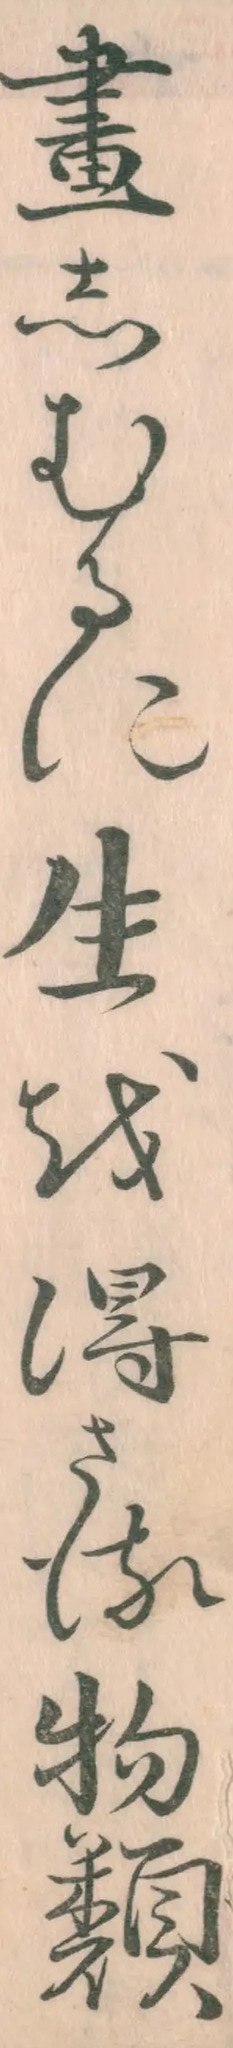書しむるに生を得さる物類
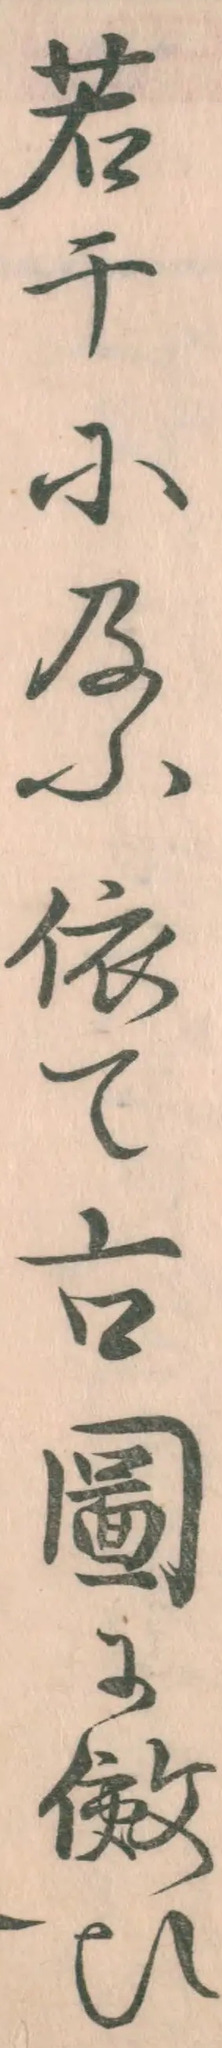若干に及ふ依て古圖に倣ひ
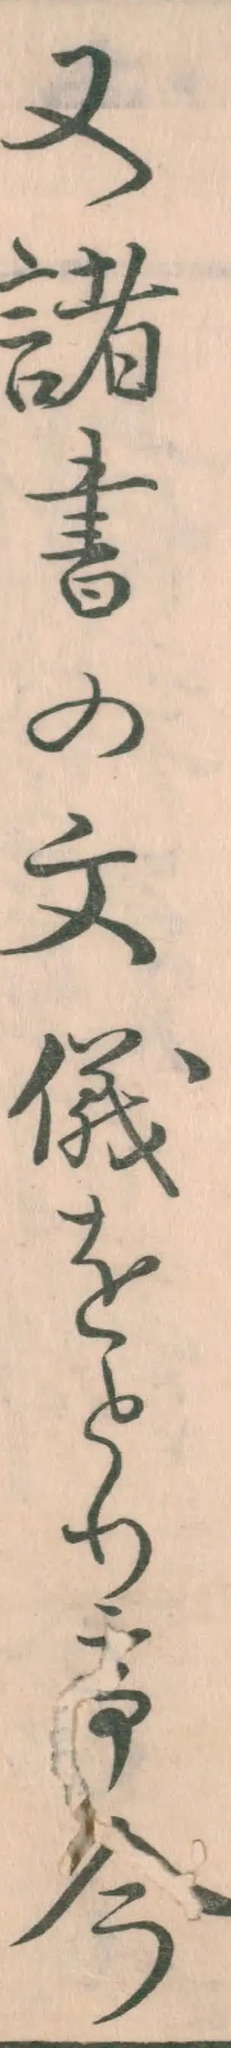又諸書の文儀をとり今
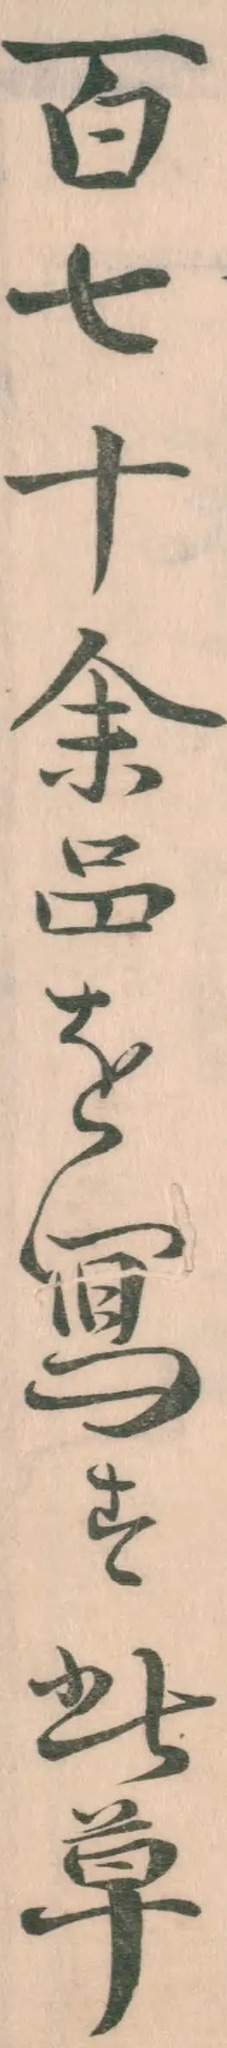百七十余品を寫す此草
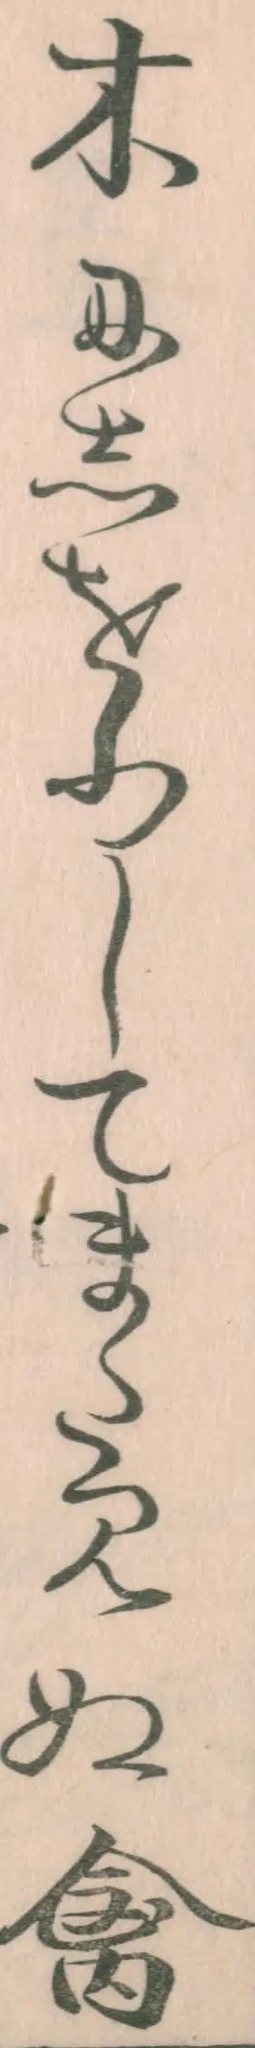木にしをりしてまた見ぬ禽
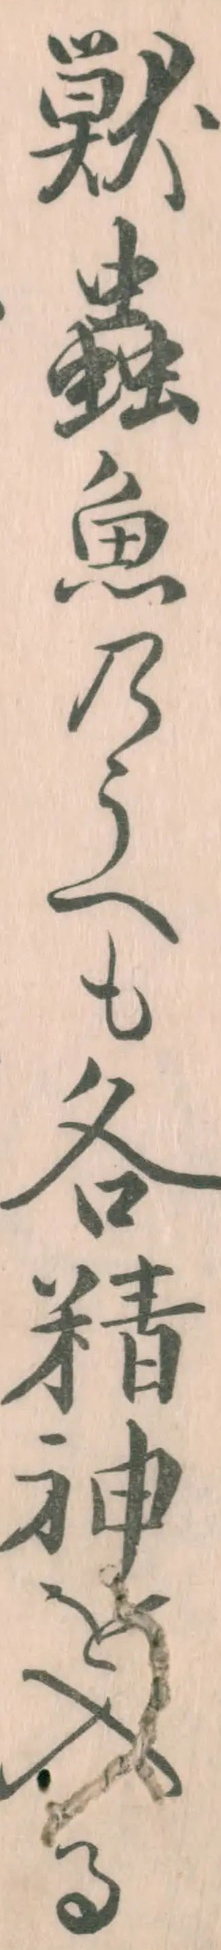獣蟲魚のうへも各精神を入る
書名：誹諧名知折 2巻. [1]
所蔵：国立国会図書館 National Diet Library, JAPAN
